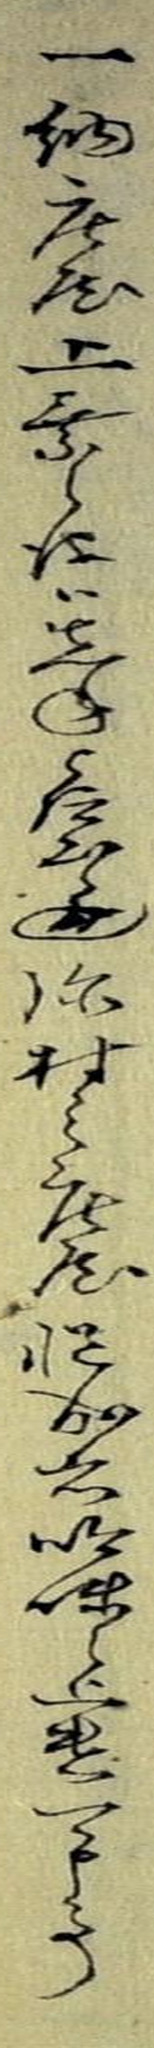一納庄屋上乗之儀ハ先年被仰出候通弥村々庄屋慥成者吟味之上遣可申事
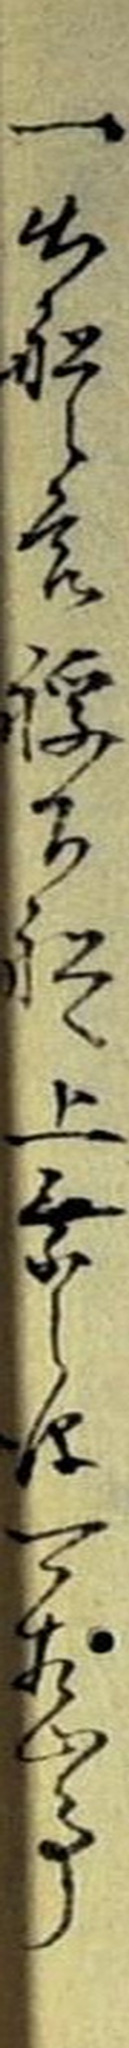一出船之節艀下船へ上乗之儀可相止事
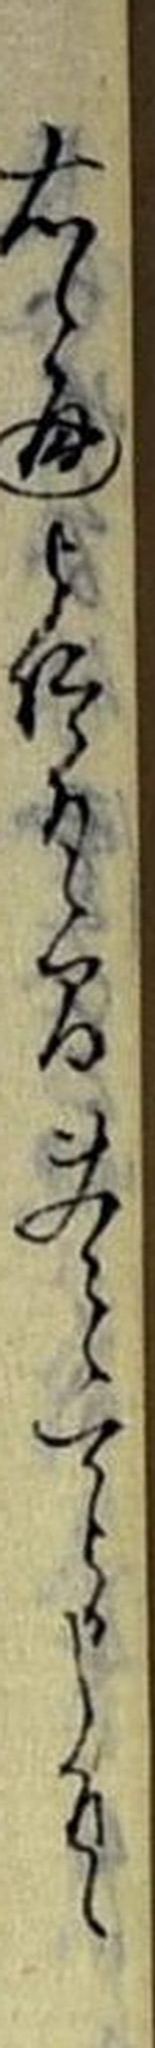右之通被仰付候間夫々へ可被申付候
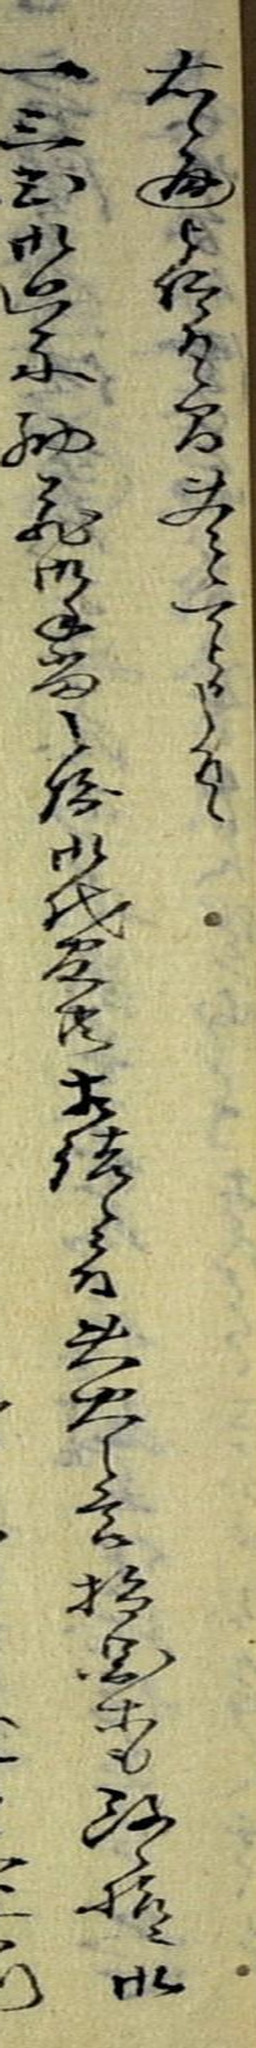一三国御廻米納蔵御手当之儀御代官共相詰候ニ付失火之節指図糖等も致候様ニ御
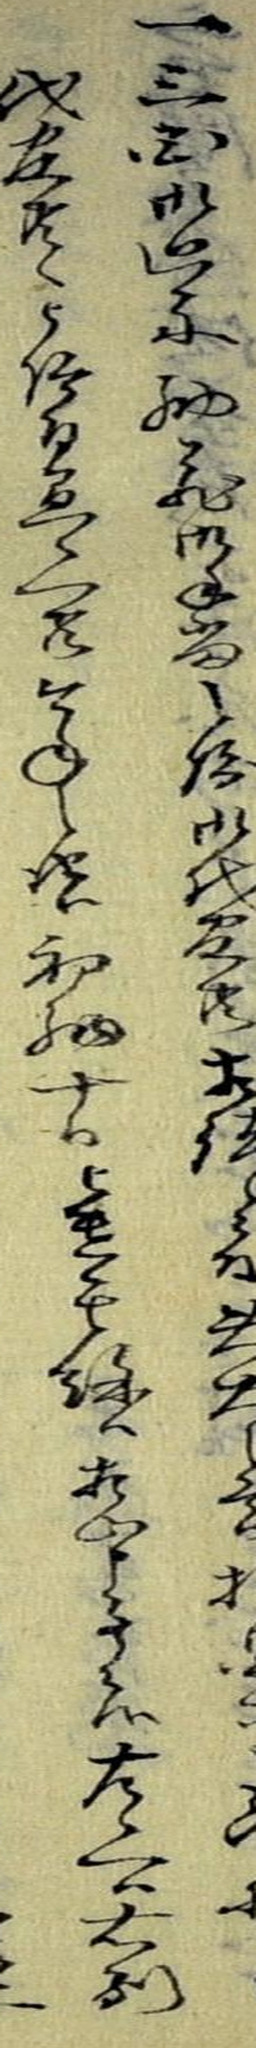代官共へ被仰付置候へ共今年之儀ハ初納十日被遣其余ハ相止申事ニ候左候ヘハ右別
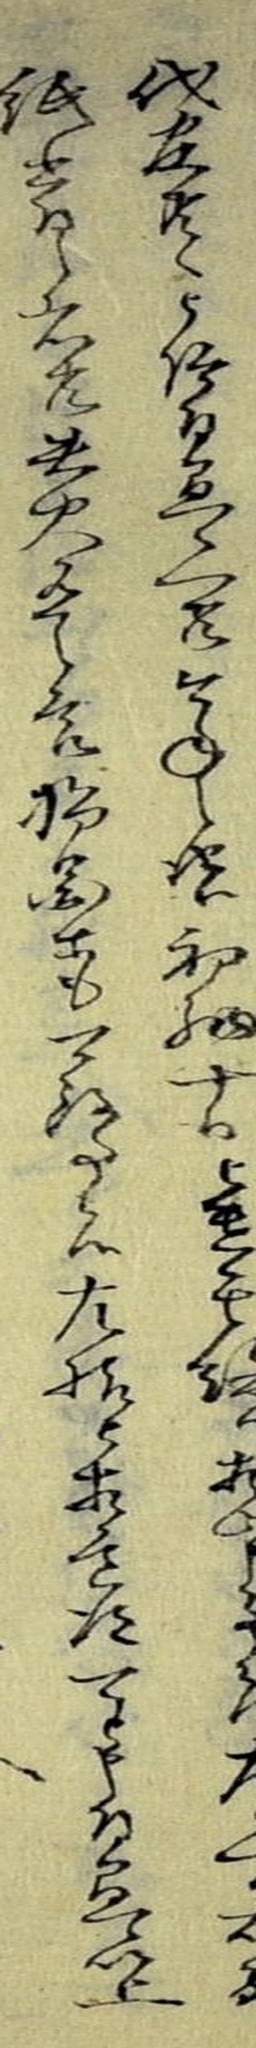紙書付之者共失火有之節指図等も可致事ニ候左様被相意得可被申付置候以上
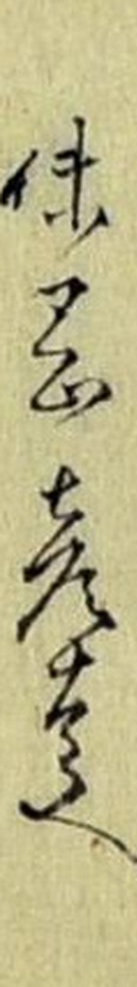味岡彦大夫
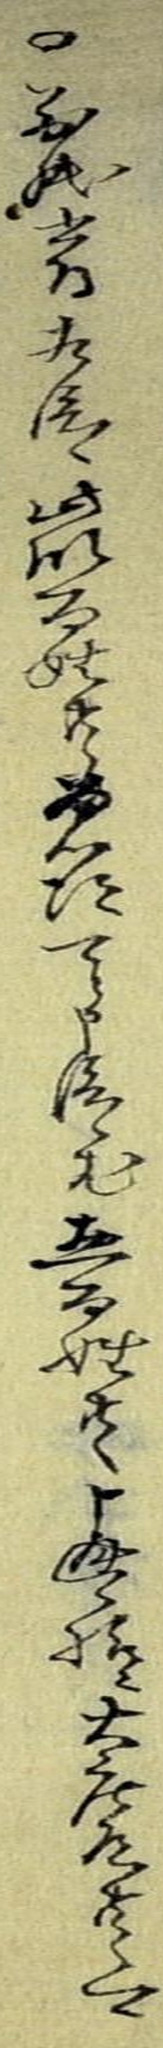〇別紙書付相渡候此段百姓共へ為心得可被申渡候尤惣百姓共へ申通候様ニ大庄屋共へ可
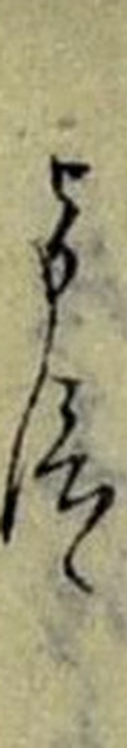被申渡候
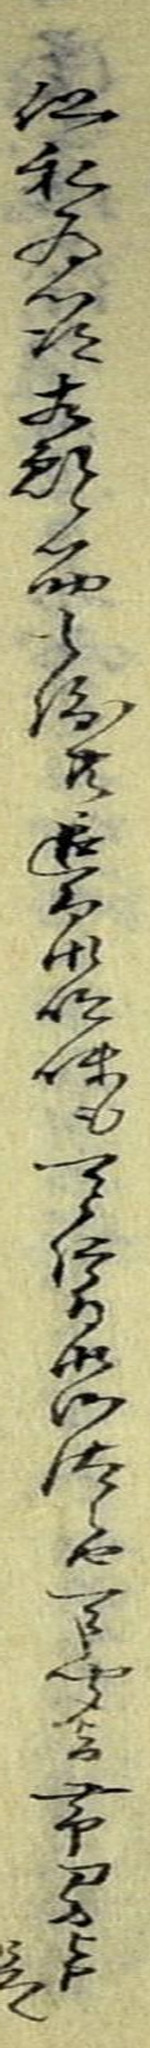但私為心得相願候筋之儀共追而御吟味も可被仰付御沙汰之由可申聞旨帯刀方申渡候
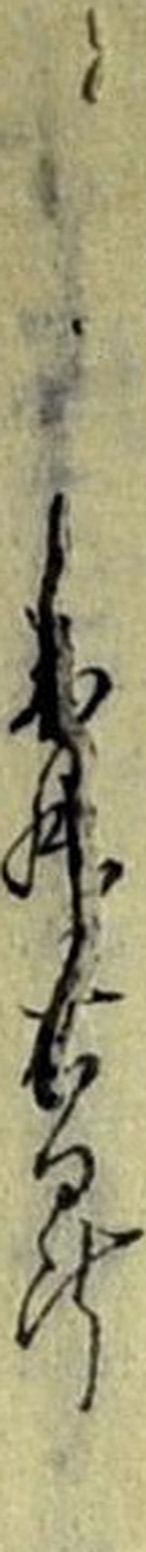別紙右同断
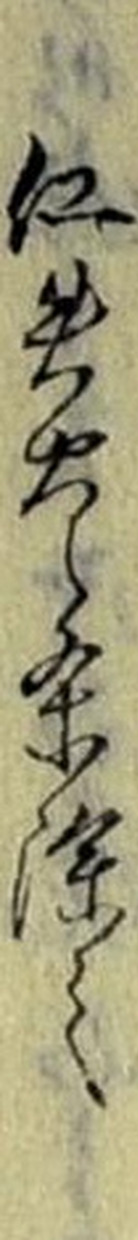但失火之条除之
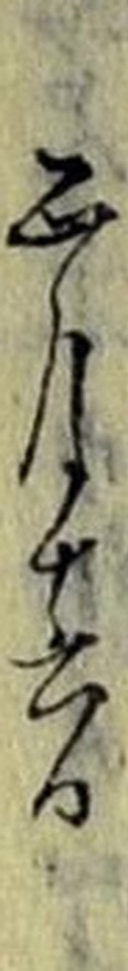正月十六日
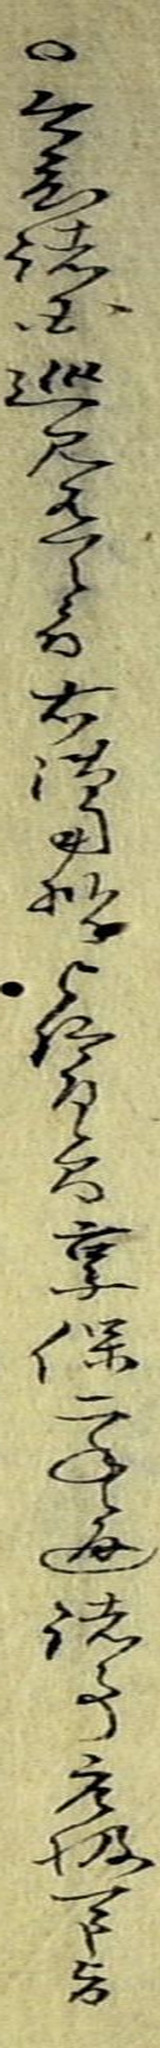〇今度諸国巡見有之ニ付右御用掛り被仰付候間享保二年之通諸事取扱可申旨
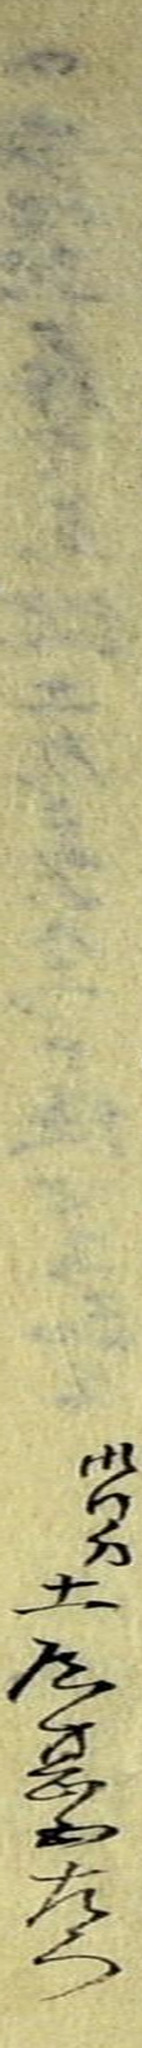御目付土屋甚五左衛門
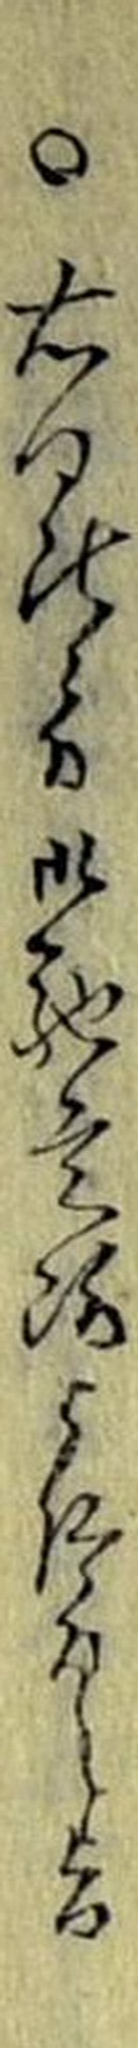〇右同断ニ付御馳走附被仰付候旨
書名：命令之部 一
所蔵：福井県文書館 Fukui Prefectural Archives
